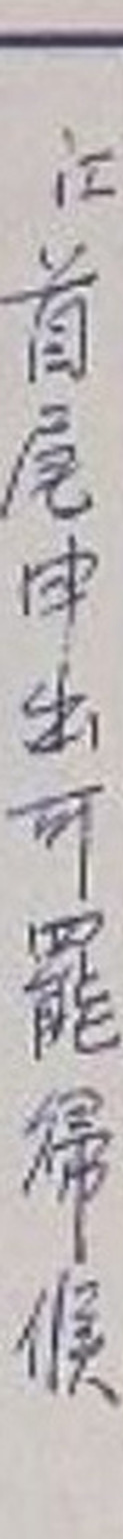え首尾申出可罷帰候
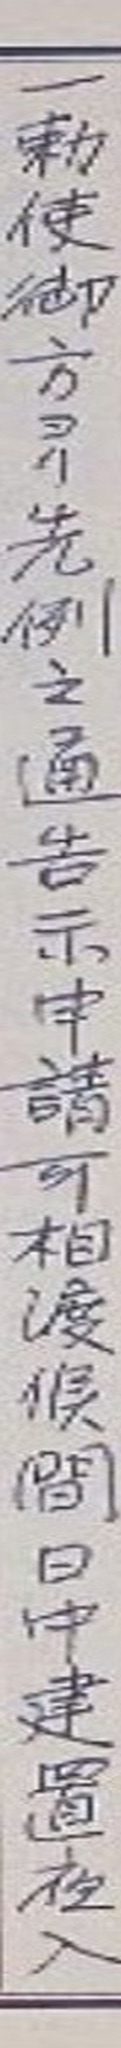一勅使御方より先例之通告示申請可相渡候間日中建置夜入
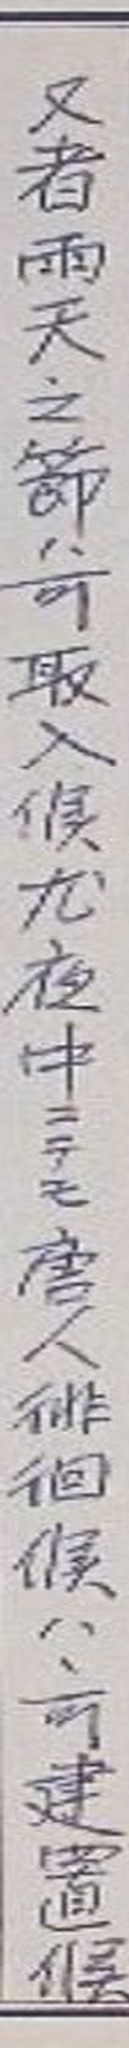又者雨天之節は可取入候尤夜中にても唐人徘徊候はゝ可建置候
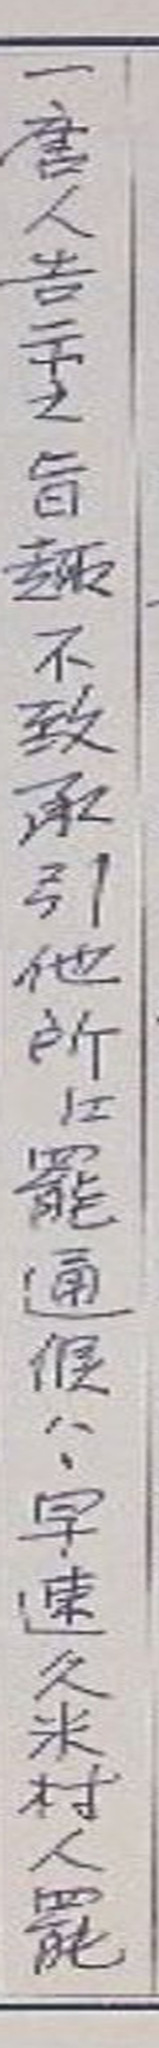一唐人告示之旨趣不致承引他所え罷通候はゝ早速久米村人罷
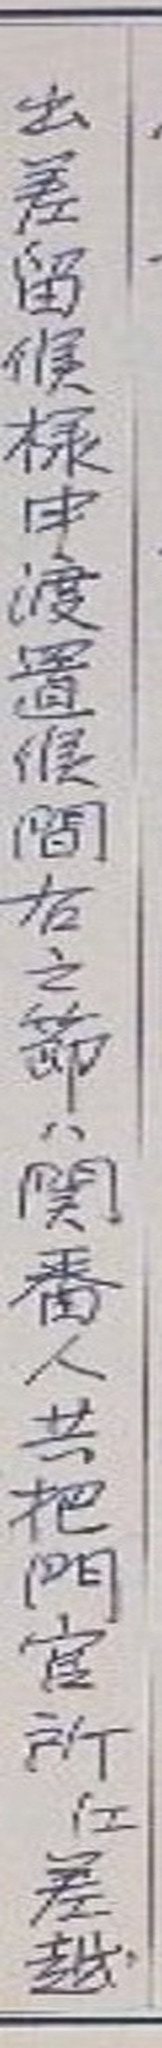出差留候様申渡置候間右之節は関番人共把門官所え差越
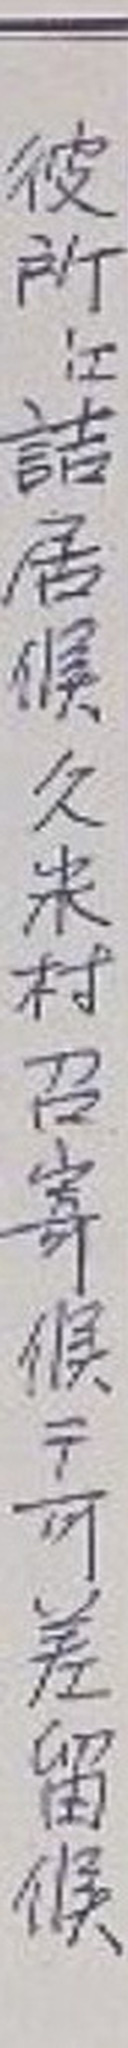彼所え詰居候久米村召寄候て可差留候
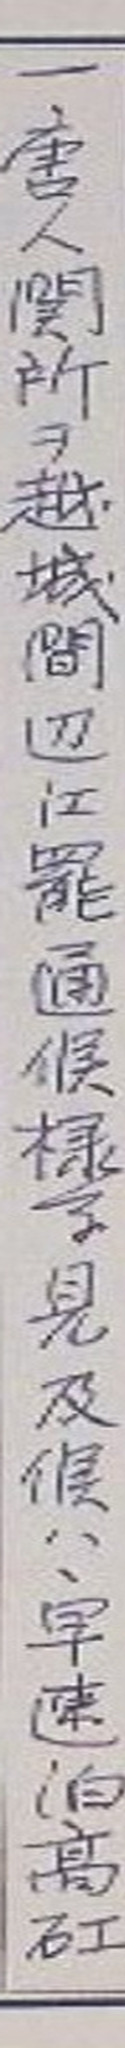一唐人関所を越城間辺え罷通候様子見及候はゝ早速泊高矼
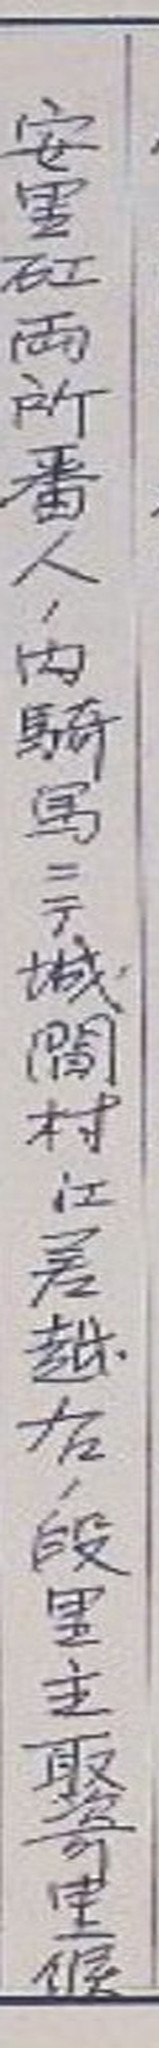安里矼両所番人の内騎馬にて城間村え差越右の段里主取次可申上候
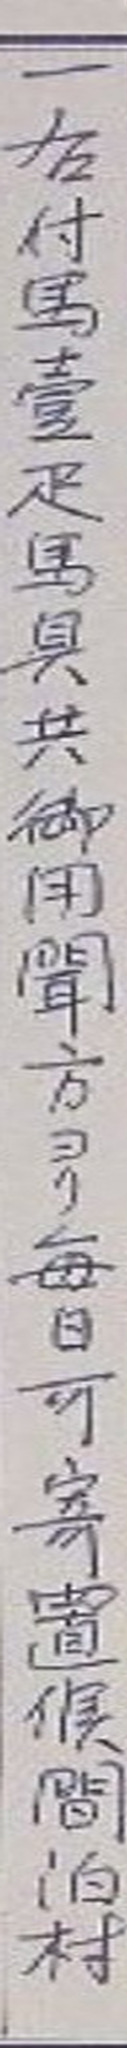一右付馬壱疋馬具共御用聞方より毎日可寄置候間泊村
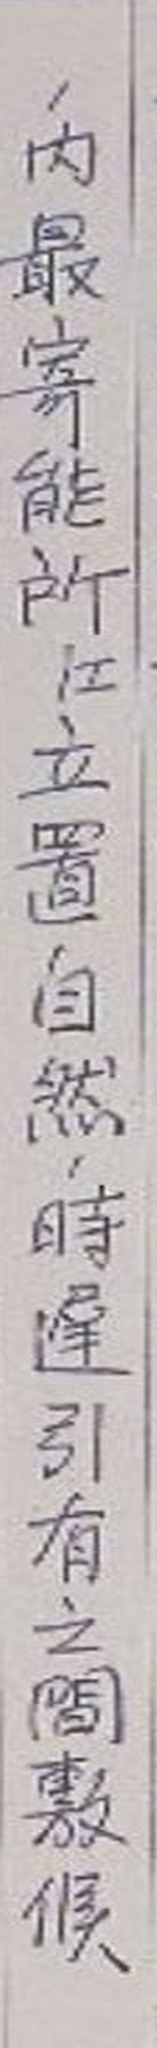の内最寄能所え立置自然の時遅引有之間敷候

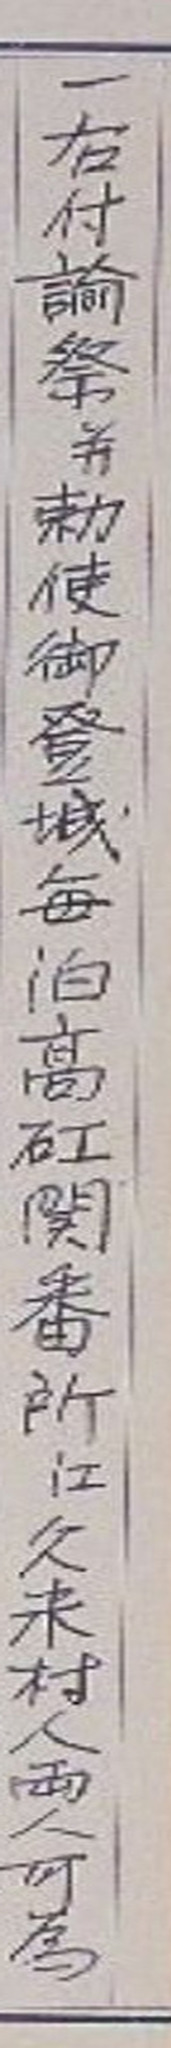一右村諭祭并勅使御登城毎泊高矼関番所え久米村人両人可為相詰候
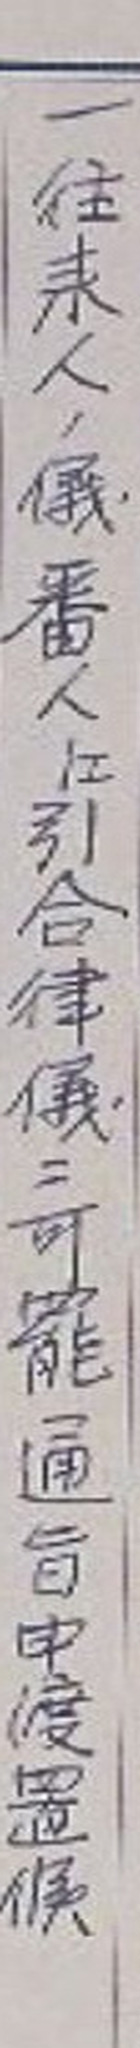一往来人の儀番人え引合律儀に可罷通旨申渡置候
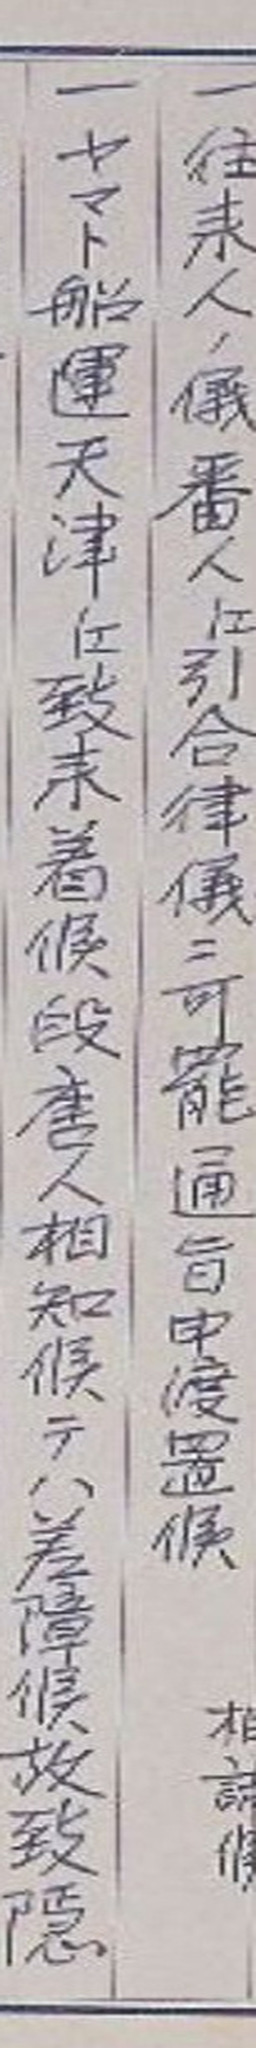一やまと船運天津え致来着候段唐人相知候ては差障候故致隠
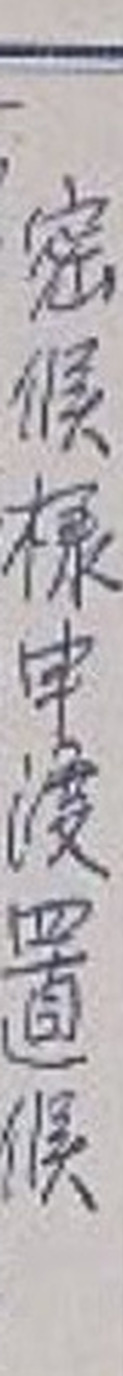密候様申渡置候
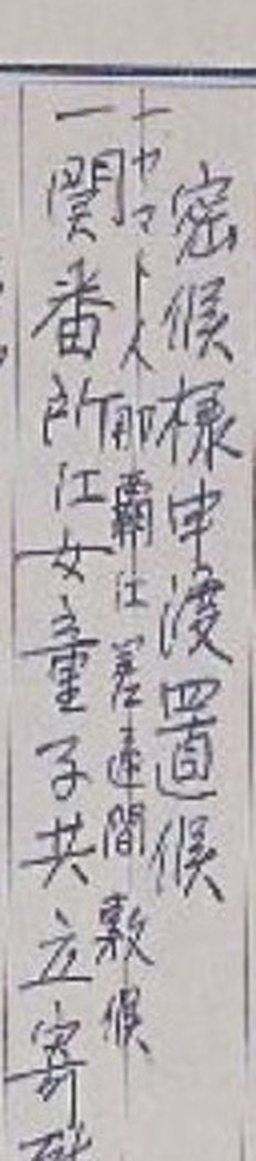一やまと人那覇え差通間敷候
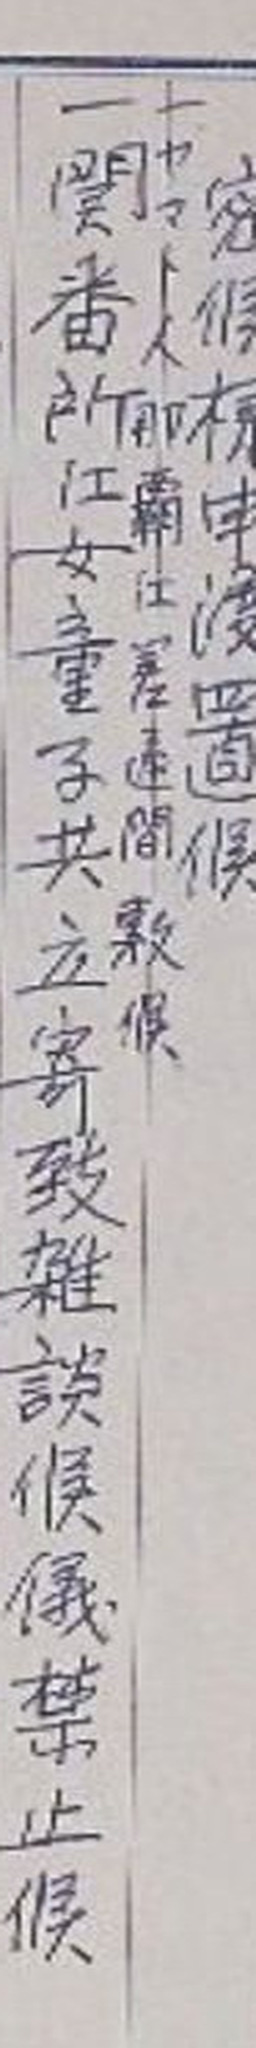一関番所え女童子共立寄致雑談候儀禁止候
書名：支那冊封使来琉諸記 下巻
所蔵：University of the Ryukyus Library
